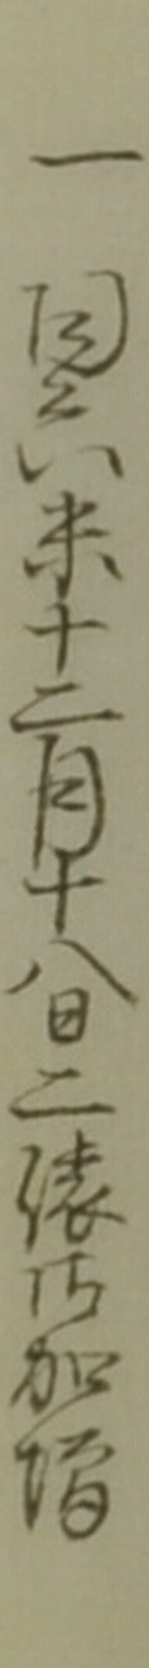一同六未十二月十八日二俵御加増

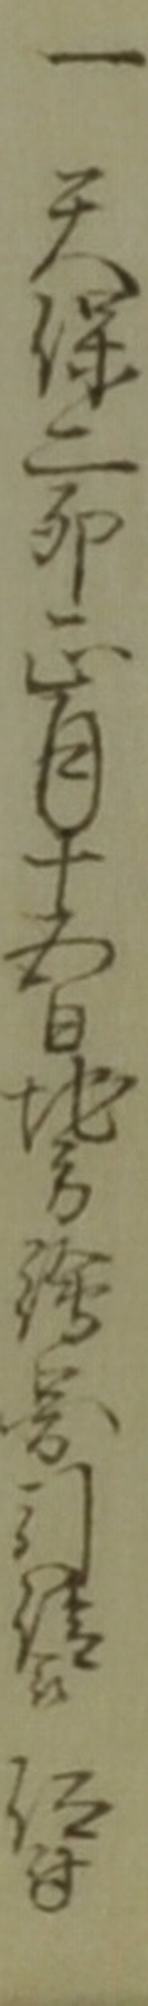一天保二卯正月十五日地方絵図引請被仰付
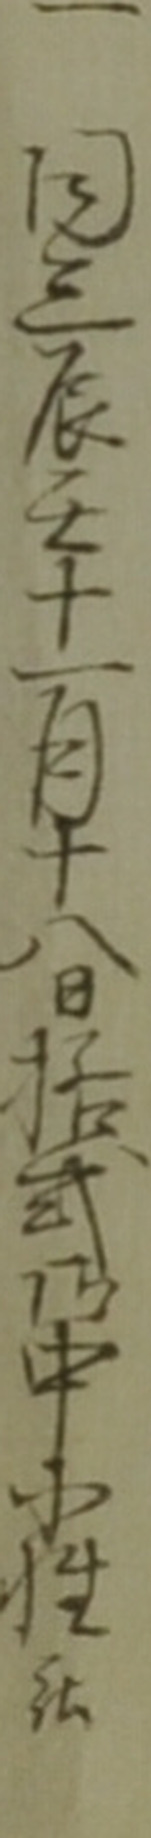一同三辰壬十一月十八日格式御中小性被
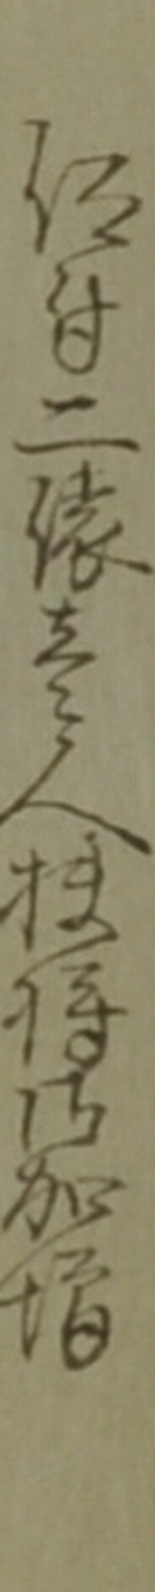仰付二俵壱人扶持御加増
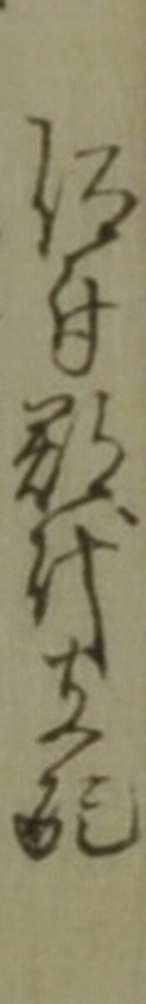仰付郡代支配
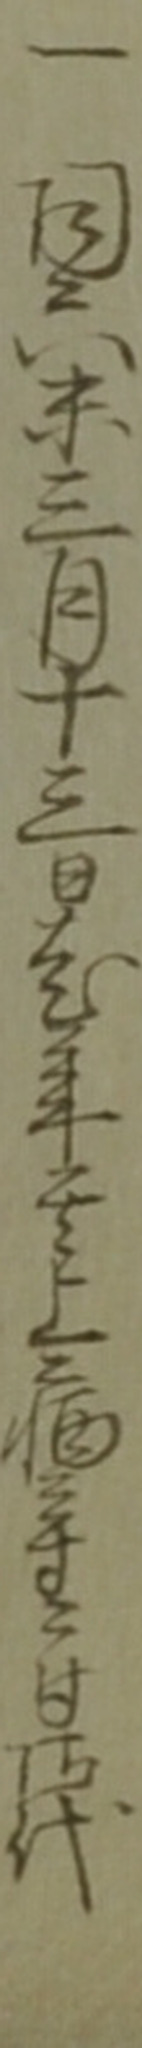一同六未三月十三日老年其上病気ニ付御代
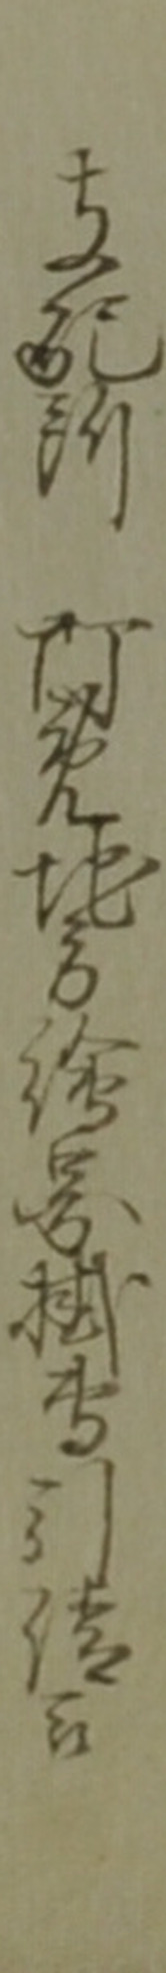支配所御免地方絵図掛専引請被
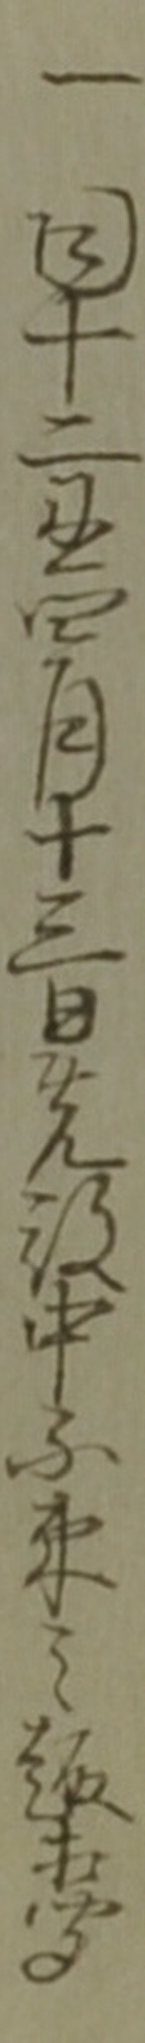一同十二丑四月十三日先役中不束之趣相守
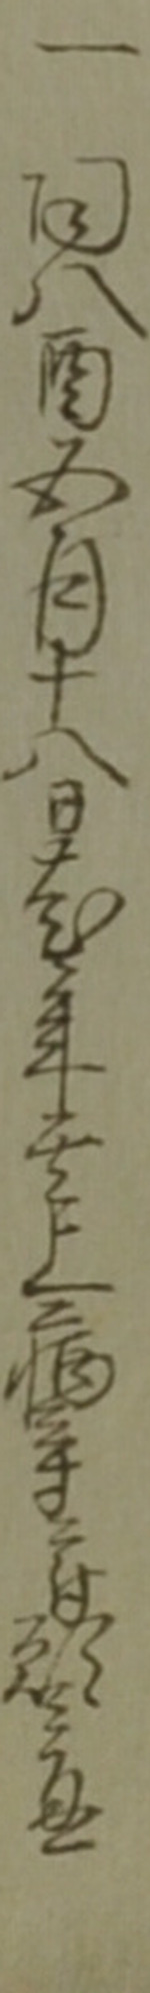一同八酉五月十八日老年其上病気ニ付願之通
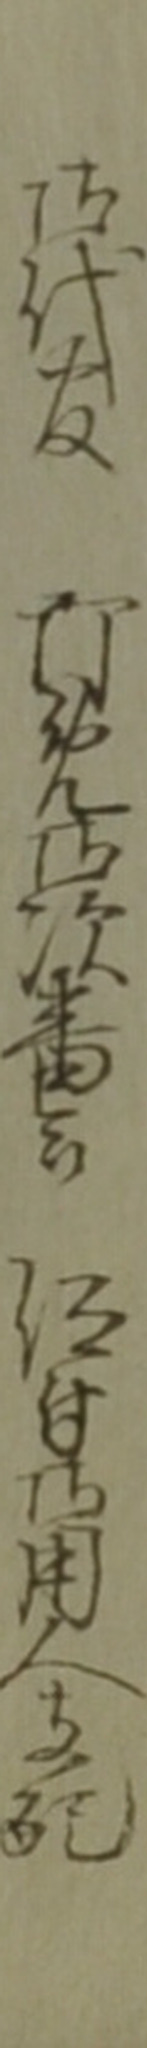御代官御免御次番被仰付御用人支配
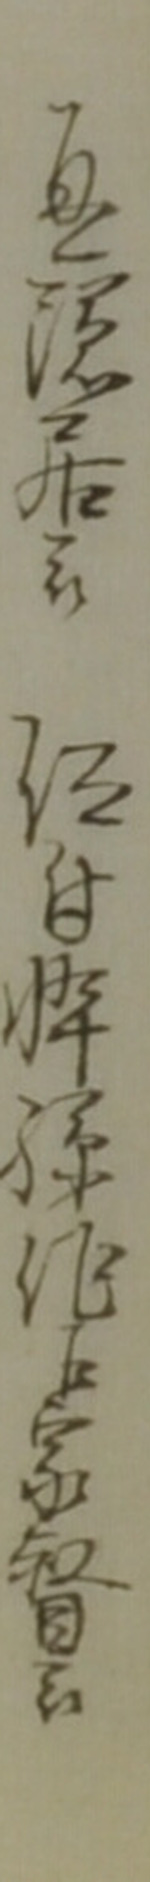通隠居被仰付忰孫作江家督被
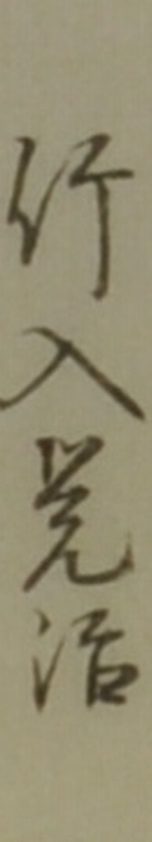行入覚治
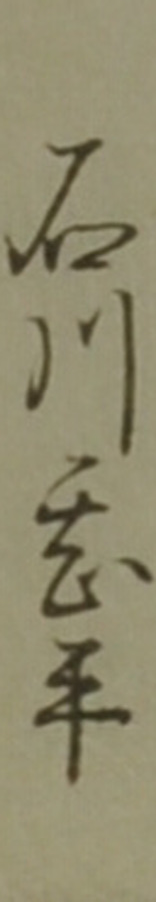石川甚午

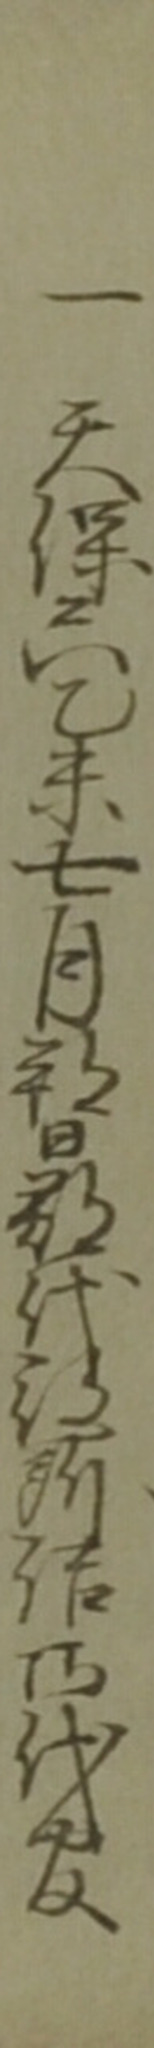一天保六乙未七月朔日郡代役所詰御代官
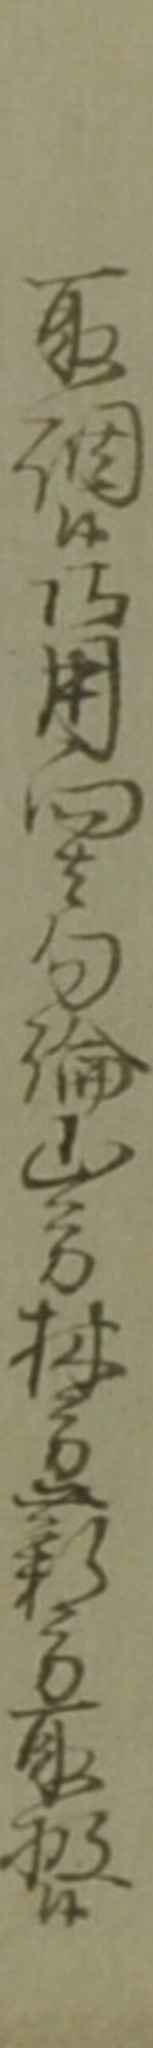取調候御用向者勿論山方林方薪方取扱候
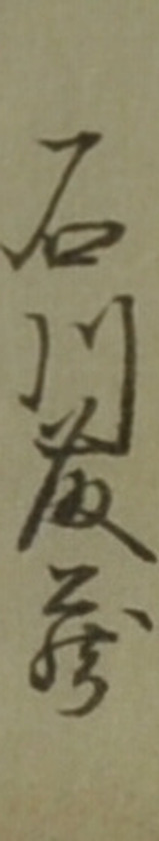石川藤蔵
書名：無足諸士勤仕録（五）
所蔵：伊那市立高遠町図書館・合同会社AMANE
